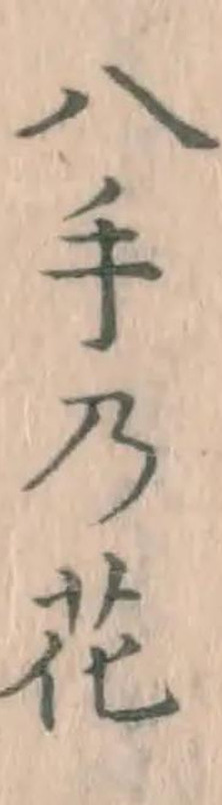八手乃花
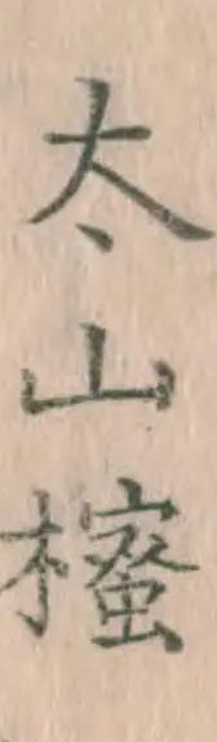太山樒
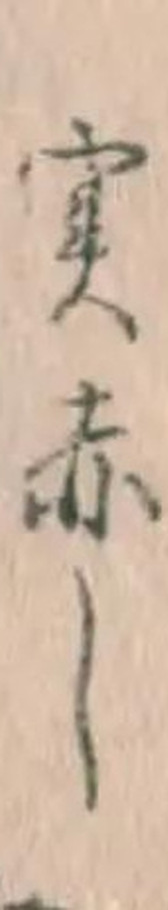実赤し

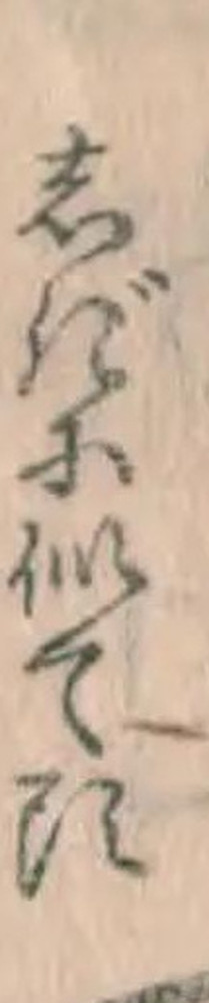しぎに似て頭
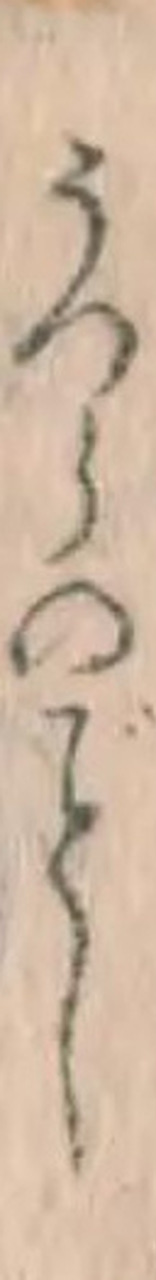うづらのごとし
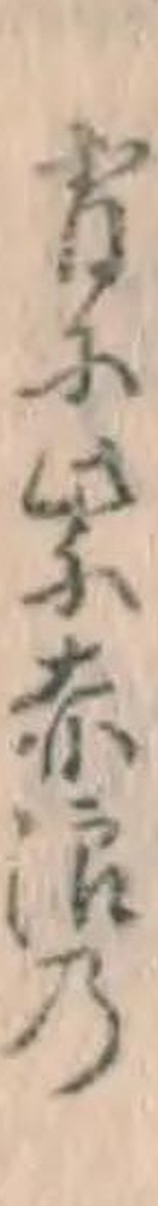背に紫赤浪の
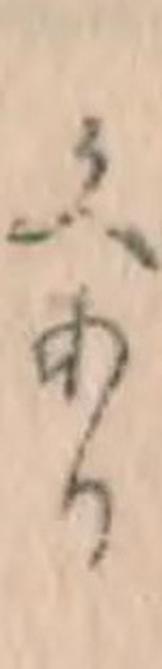文あり
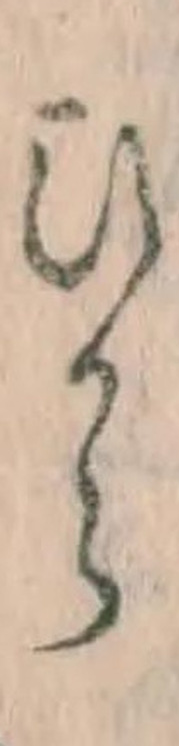ひから
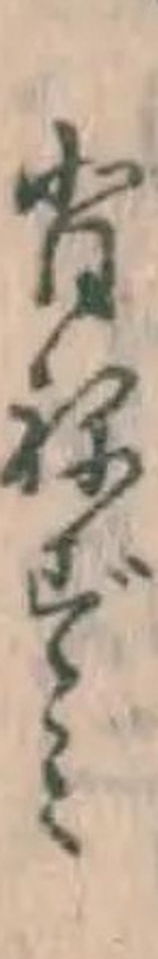背ねずみ
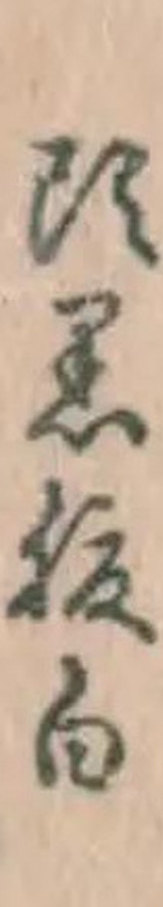頭黒腹白
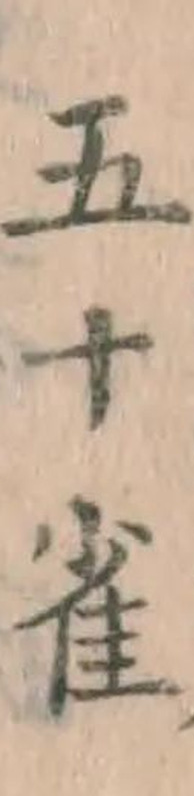五十雀
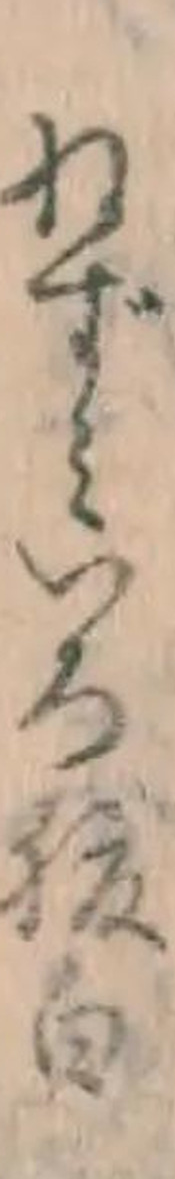ねずみいろ腹白
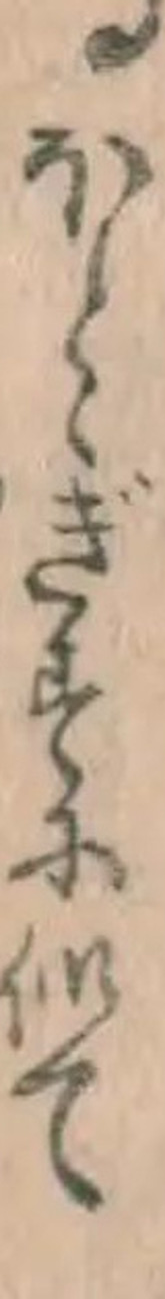ほとゝぎすに似て
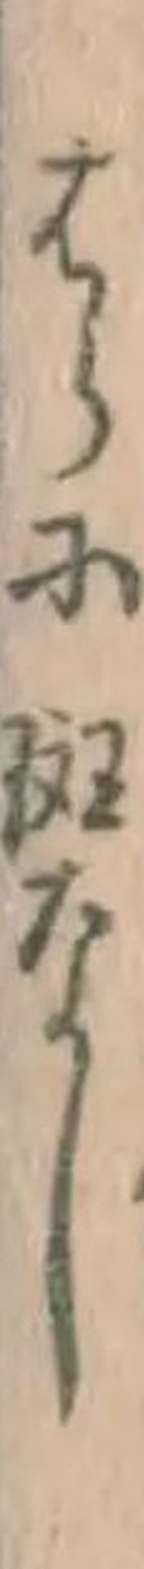はらに斑なし
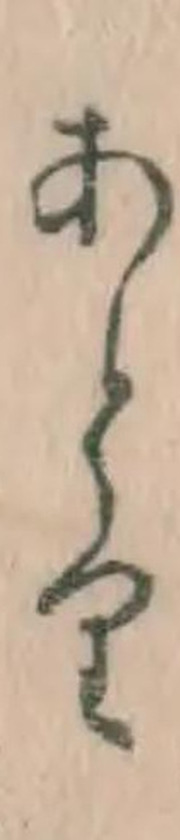あとり
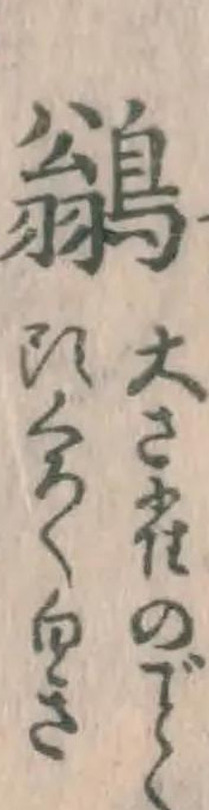大さ雀のごとく
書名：誹諧名知折 2巻. [2]
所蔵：国立国会図書館 National Diet Library, JAPAN
